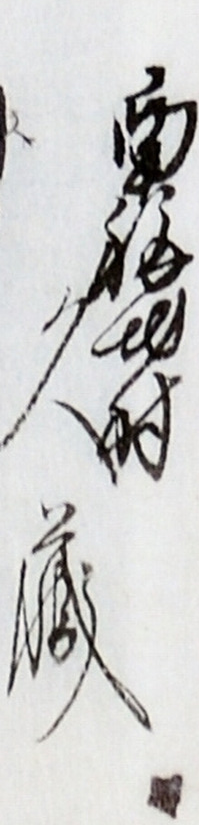南福地村
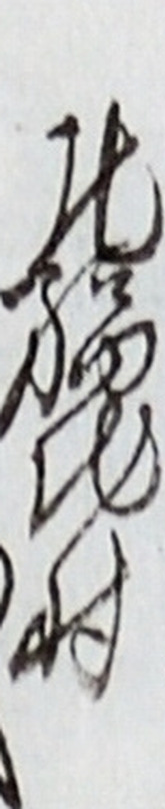北福地村
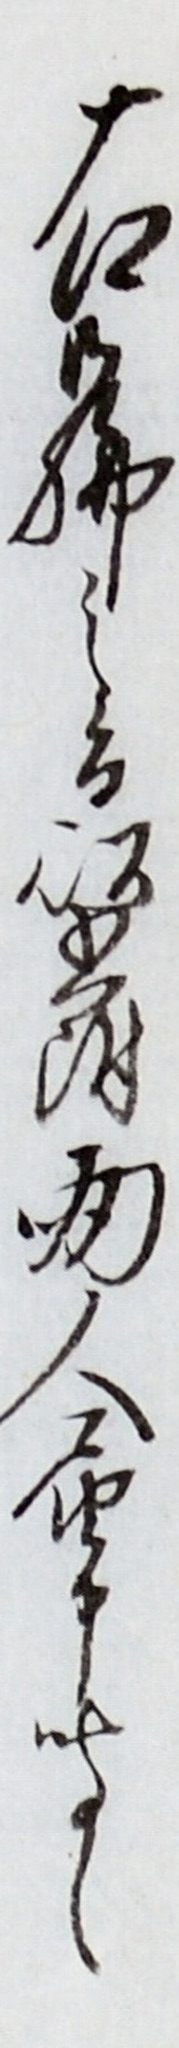右御払之旨以御取附両人届申聞候
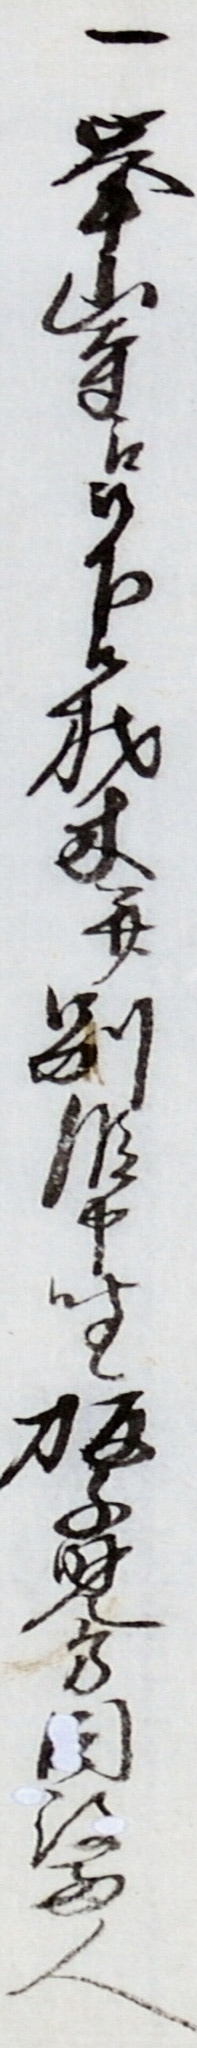一峯山寺江被下候材木并別段申聞候板子見分同役両人
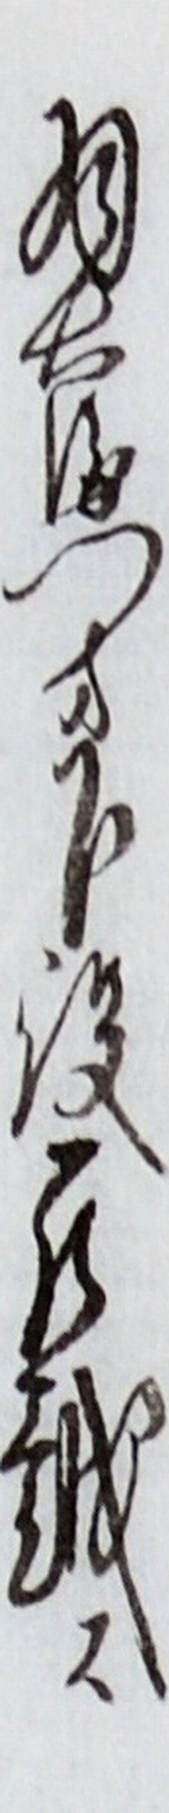羽右衛門方下役罷越ス
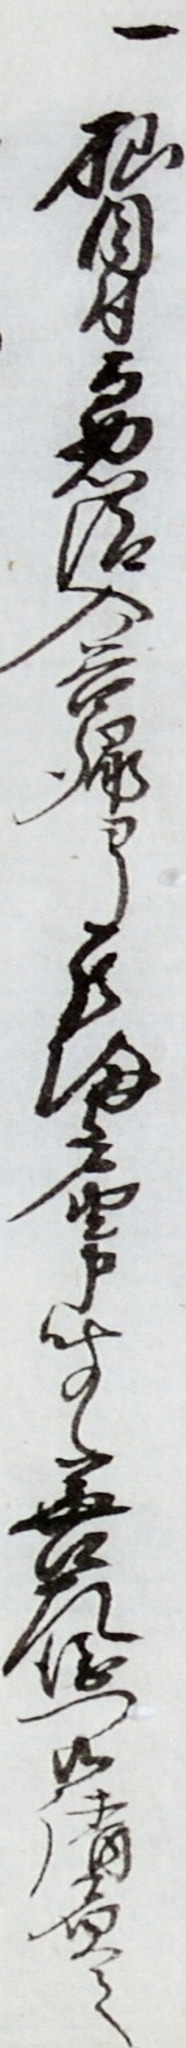一杣目付与惣治入ノ谷郷ヨリ罷帰届申聞善右衛門御請負之
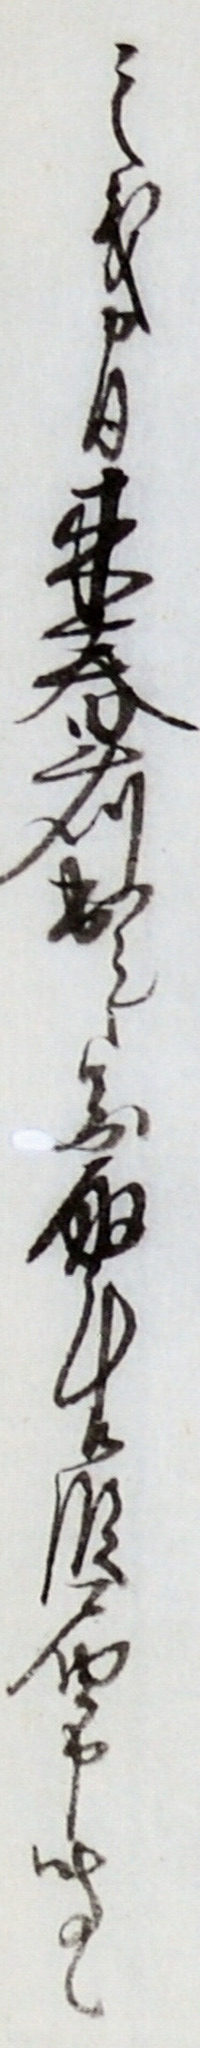之義ニ付来春刈出し候図届斗候段届申聞候

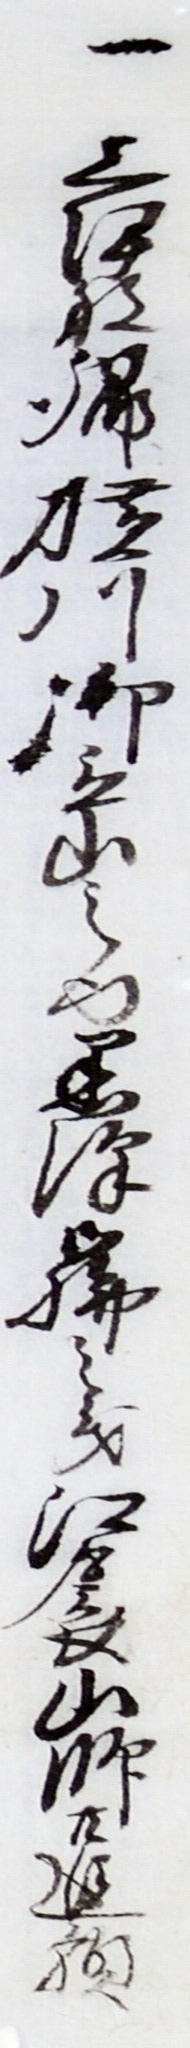一上伊那郷横川御立山之内黒沢御払之義江戸表山師共進願
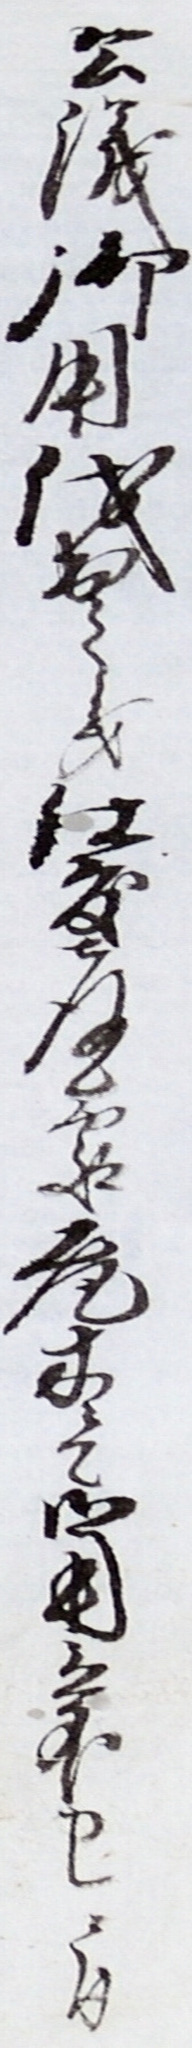公儀御用伐出之義仕度御座候処産木ニて御用意申候ニ付
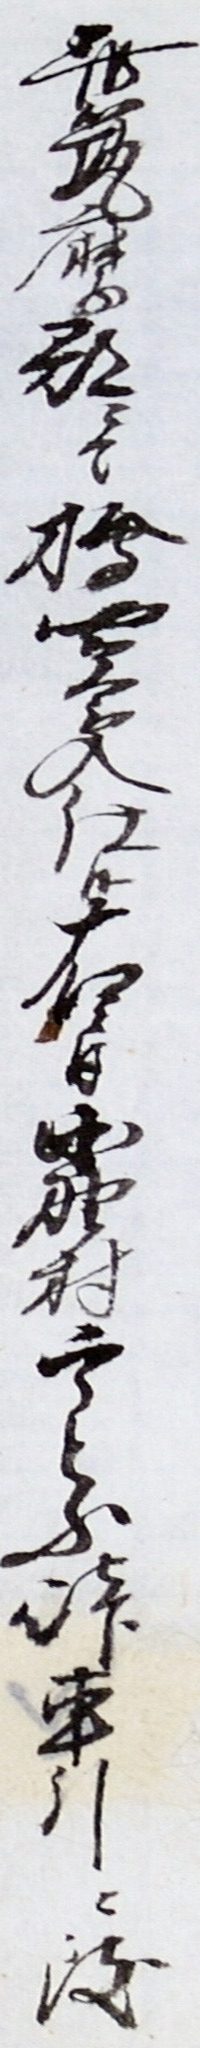此筑摩郡ニて檜買受仕候右ニ付小野村うとふ峠車引ニ致
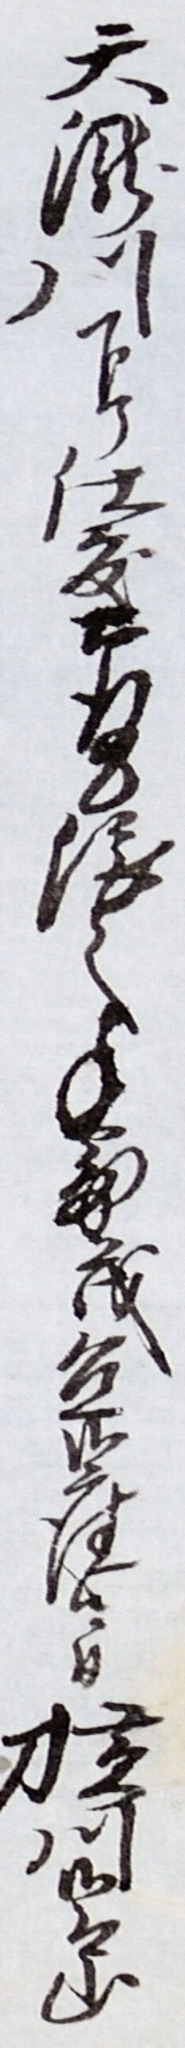天瀧川下り仕度奉存候依之手益も御座候ニ付横川御立山
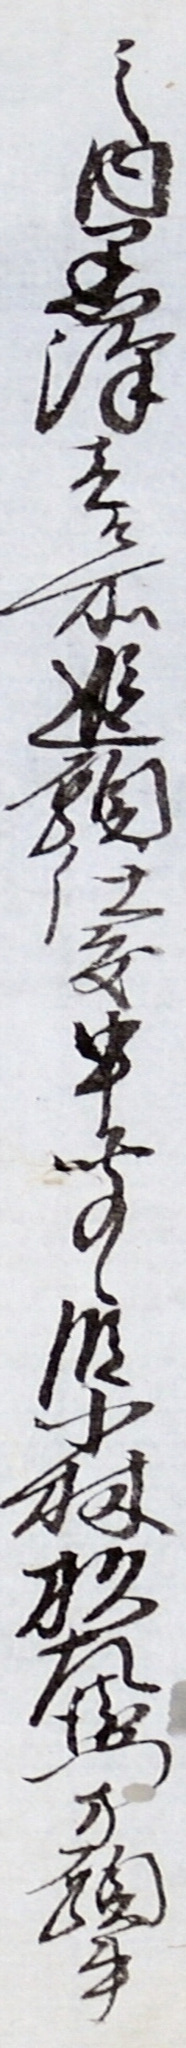之内黒澤壱ヶ所追願仕度申聞候段小林杉左衛門方願中
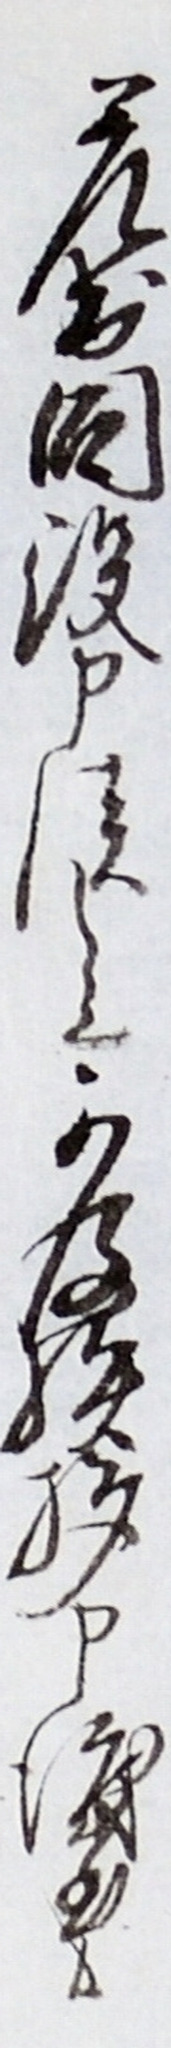差出同役申談之上可及挨拶申渡置候
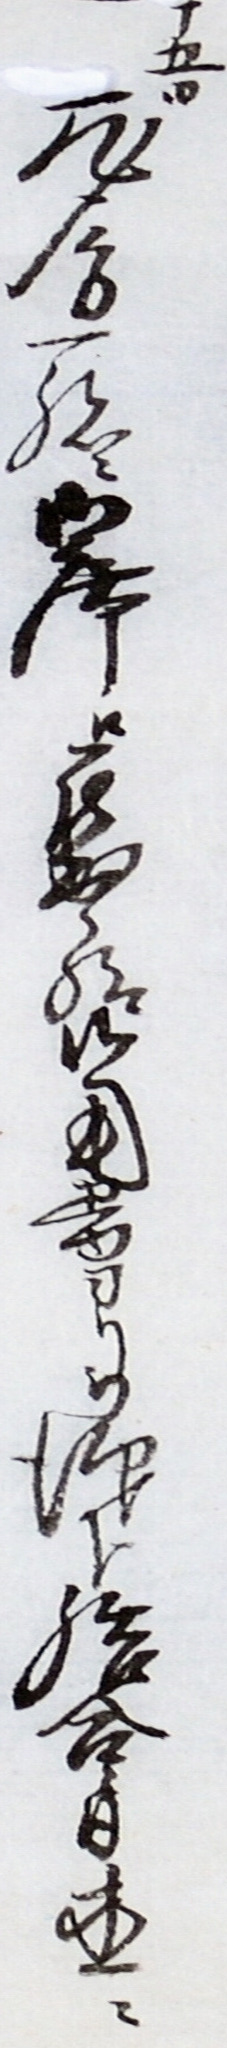一元〆方一緒に御席江罷出候様御用番ヨリ被仰下諸合ニ付直ニ
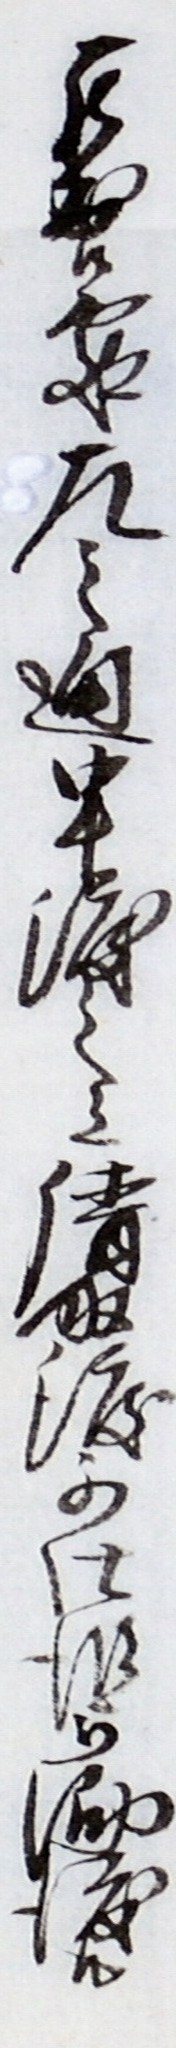罷出候処左之通申渡候之上請取渡可仕段御働渡候
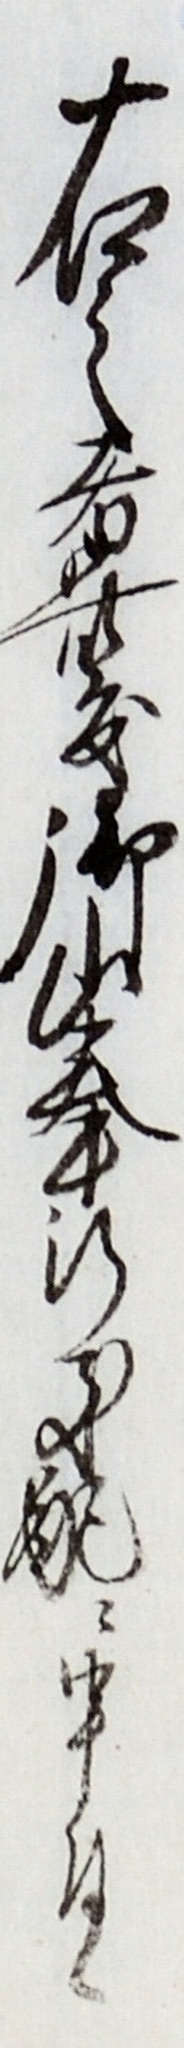右之者此度御山奉行支配ニ申付候
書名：御山奉行御用控
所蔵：伊那市立高遠町図書館・合同会社AMANE
